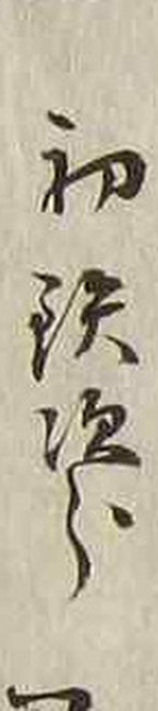初鉄次郎
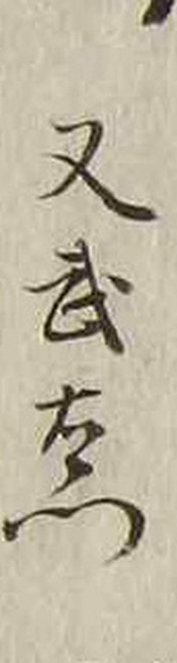又武右衛門

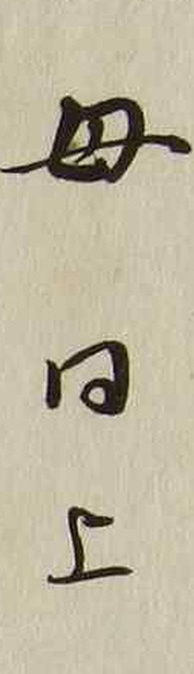母同上
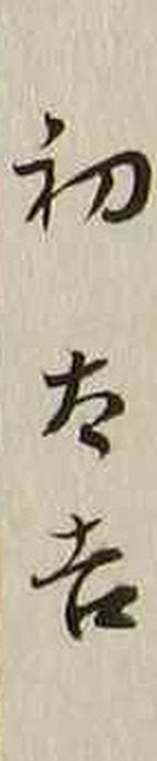初太吉
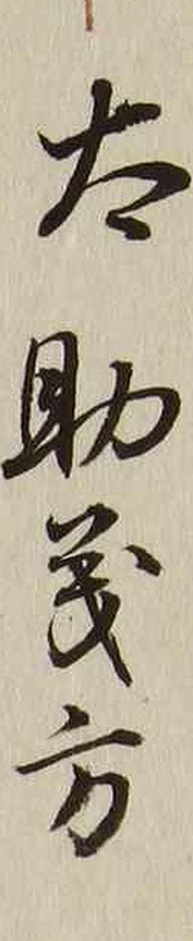太助義方
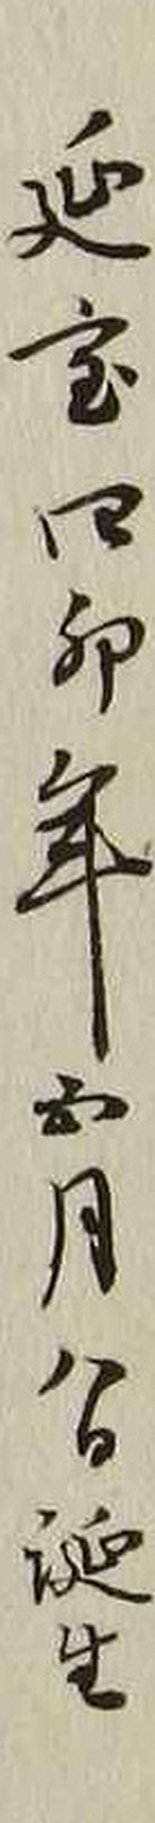延宝四卯年五月八日誕生
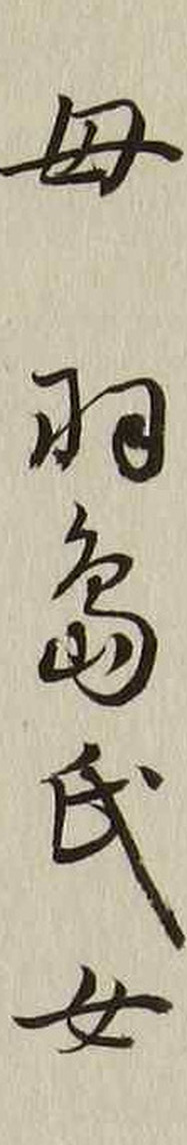母羽島氏女
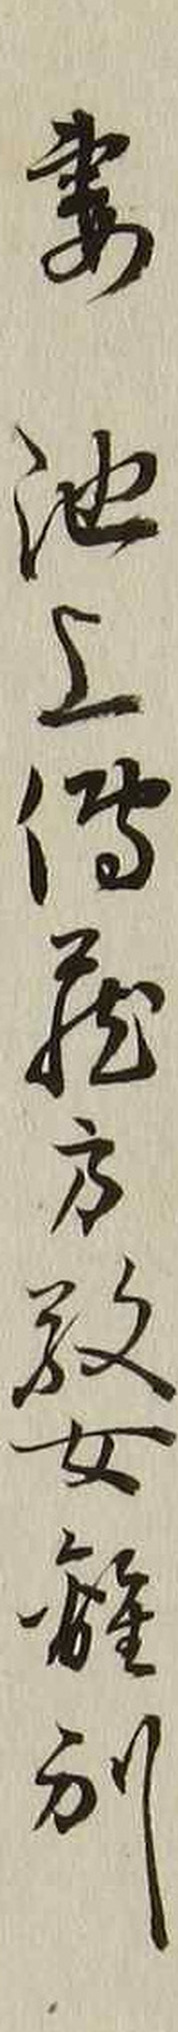妻池上傳蔵方敬女離別
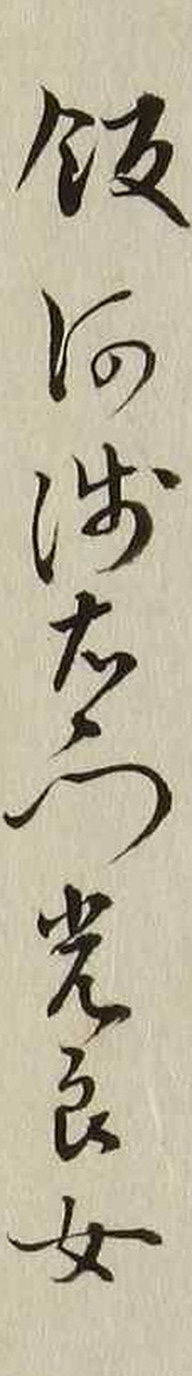飯河浅右衛門光良女
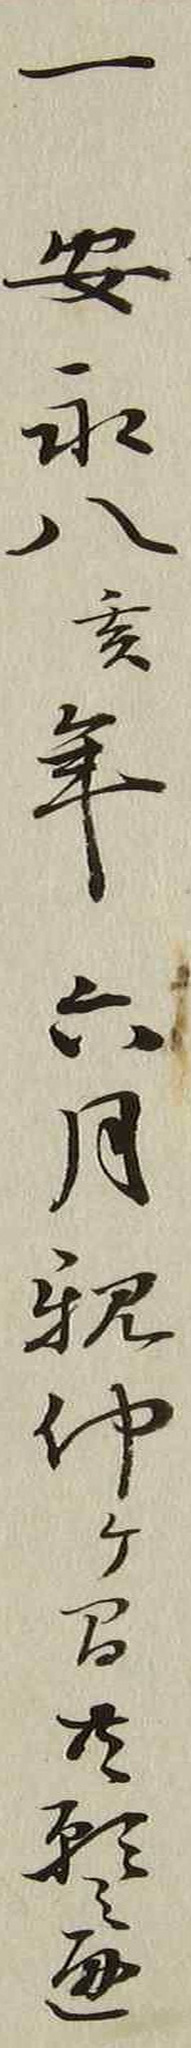一安永八亥年六月親仲ケ間共願い之通り
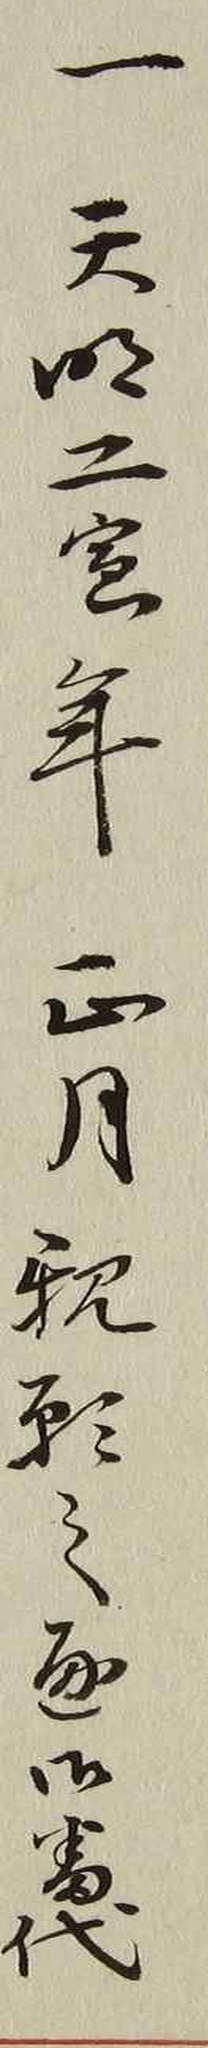一天明二寅年正月親願い之通御番代
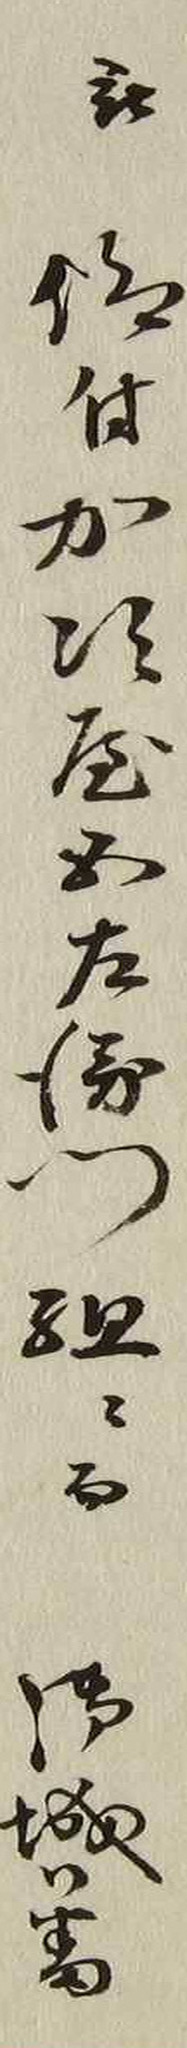仰せ付けられ加須屋五左衛門組ニて御城御番
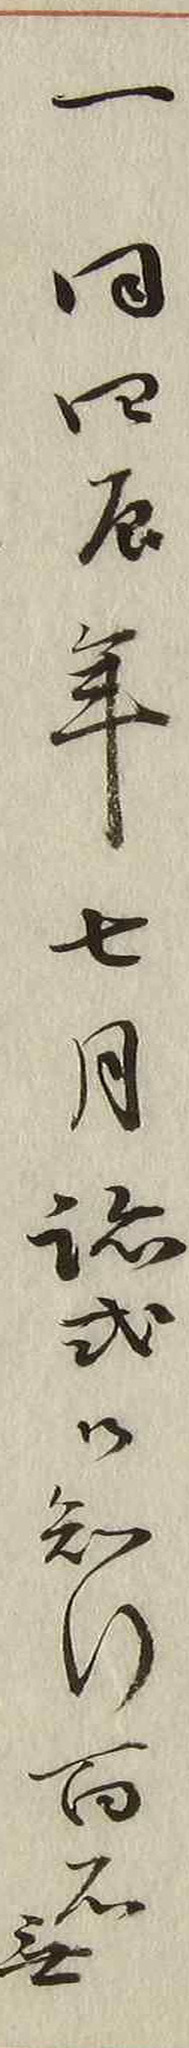一同四辰年七月跡式御知行百石
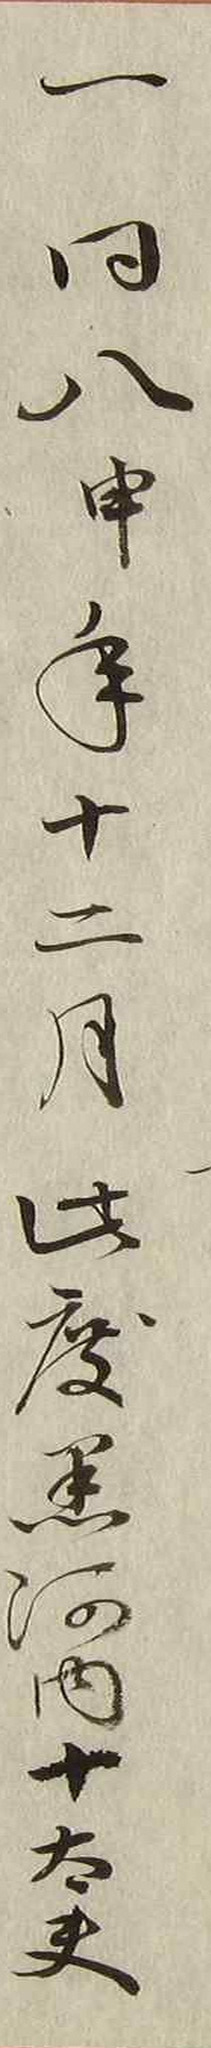一同八申年十二月此度黒河内十太夫へ対
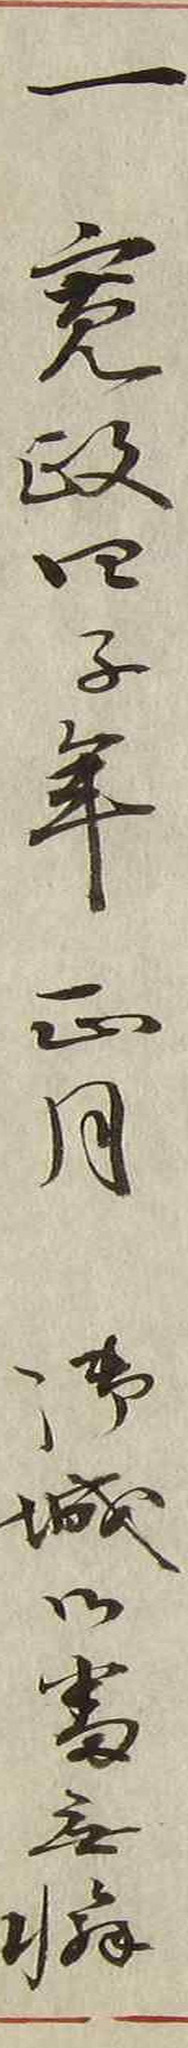一寛政四子年正月御城御番懈怠無く

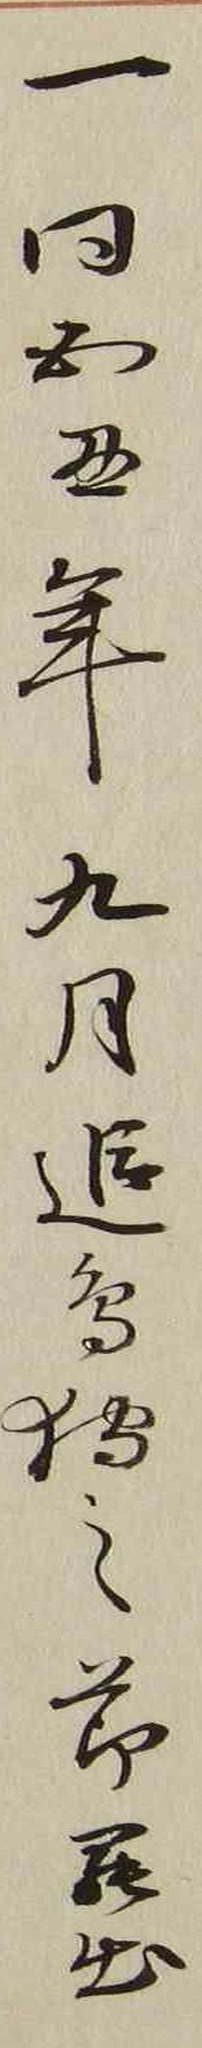一同五丑年九月追鳥狩之節罷り出
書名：諸士系譜　巻之16　い之部16
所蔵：会津若松市立会津図書館
